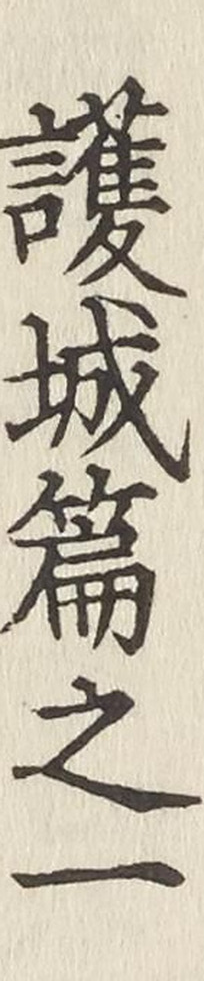護城篇之一
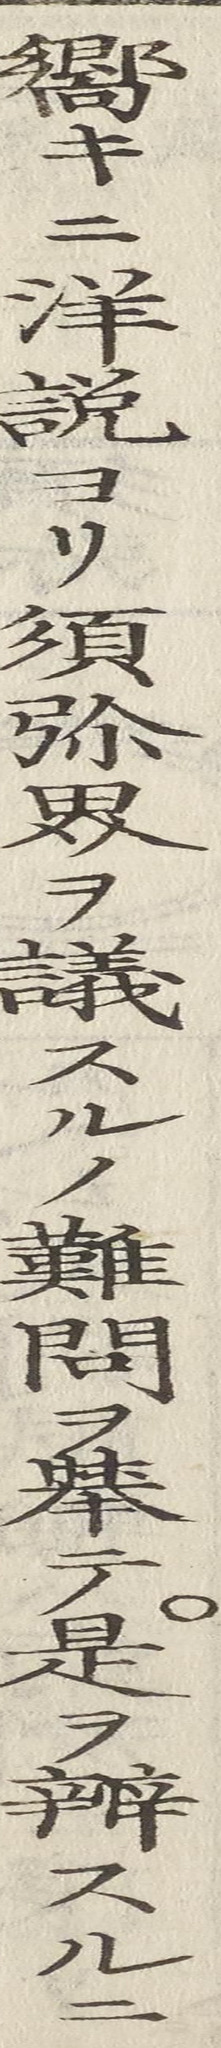嚮キニ洋説ヨリ須弥界ヲ議スルノ難問ヲ挙テ。是ヲ弁スルニ
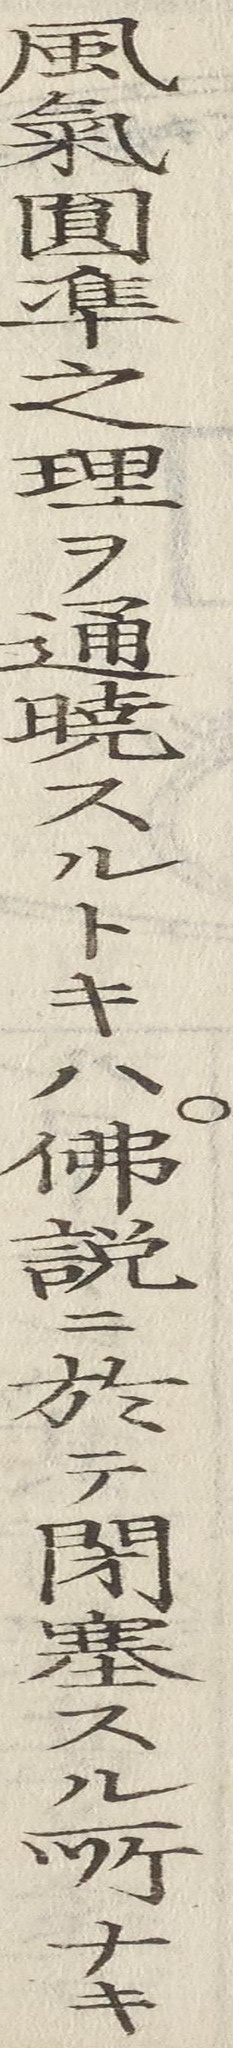風気円準之理ヲ通暁スルトキハ。仏説ニ於テ閉塞スル所ナキ
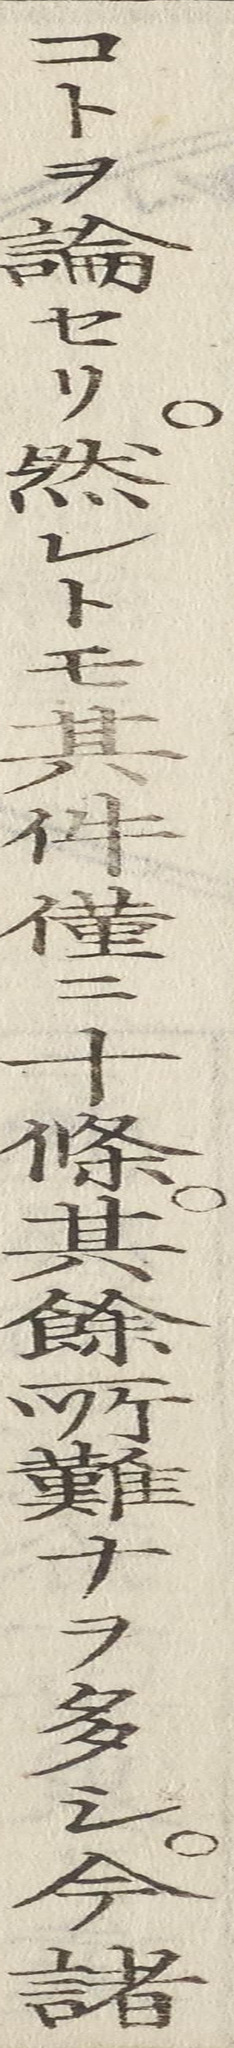コトヲ論セリ。然レトモ其件僅ニ十条。其余所難ナヲ多シ。今諸
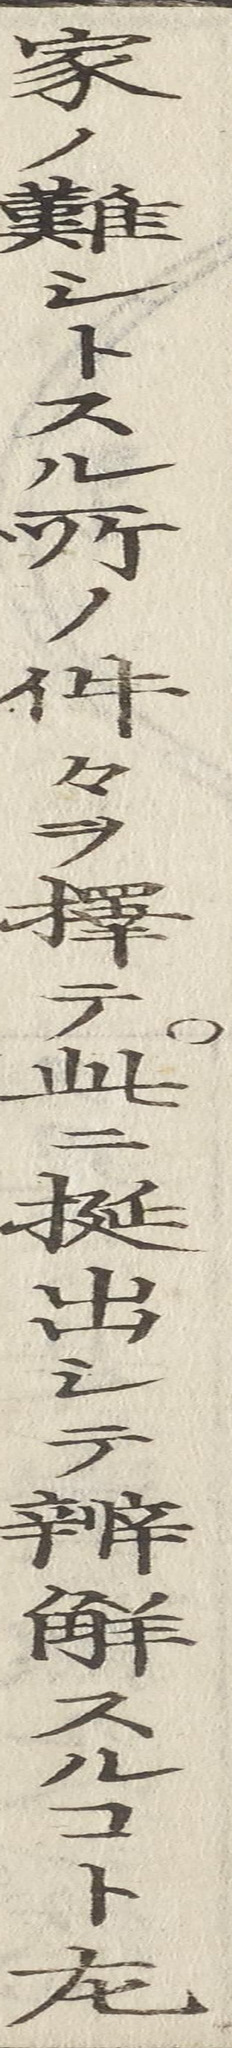家ノ難シトスル所ノ件々ヲ擇テ。此ニ挺出シテ弁解スルコト左
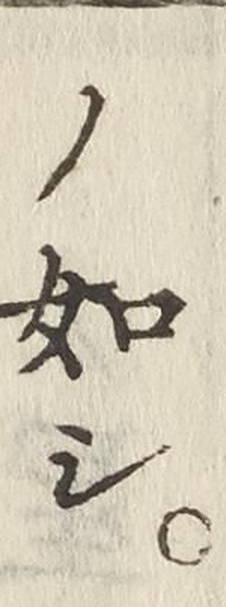ノ如シ。
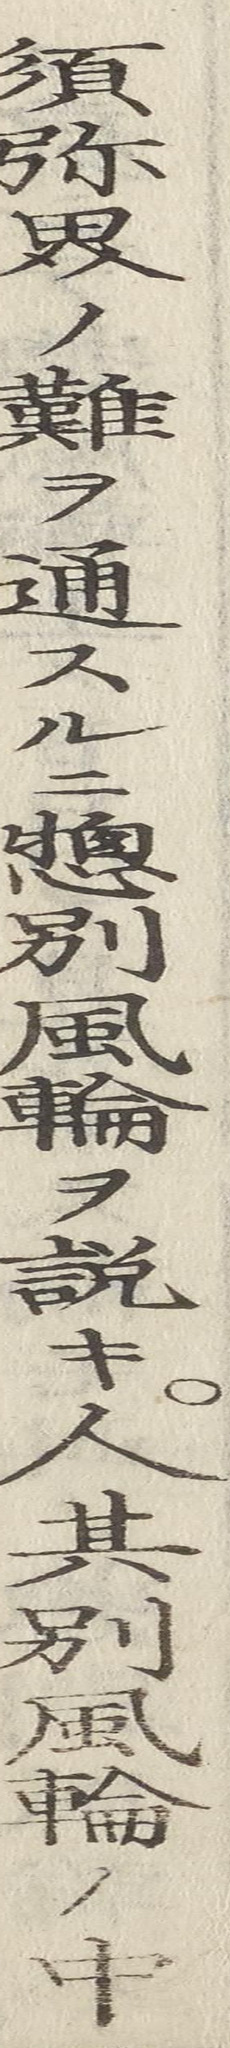須弥界ノ難ヲ通スルニ総別風輪ヲ説キ。人其別風輪ノ中

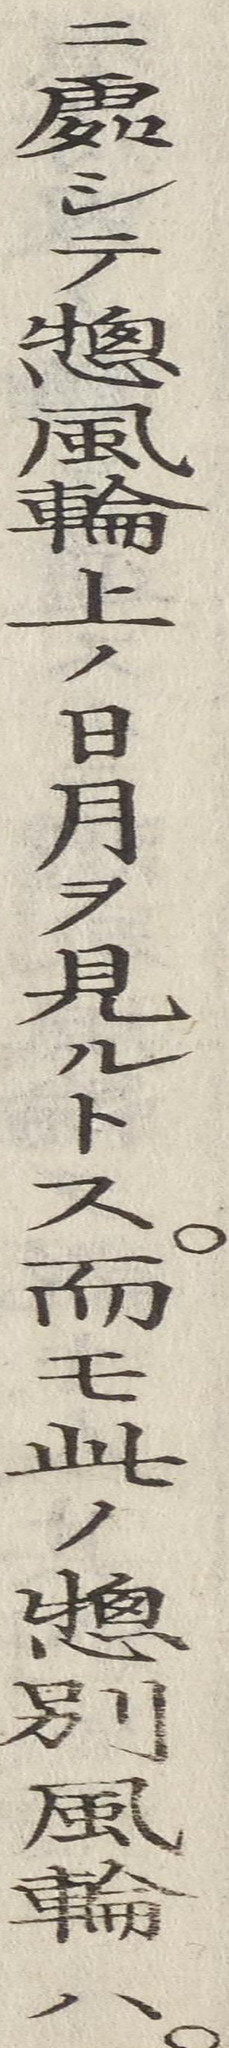ニ処シテ惣風輪上ノ日月ヲ見ルトス。而モ此ノ惣別風輪ハ。
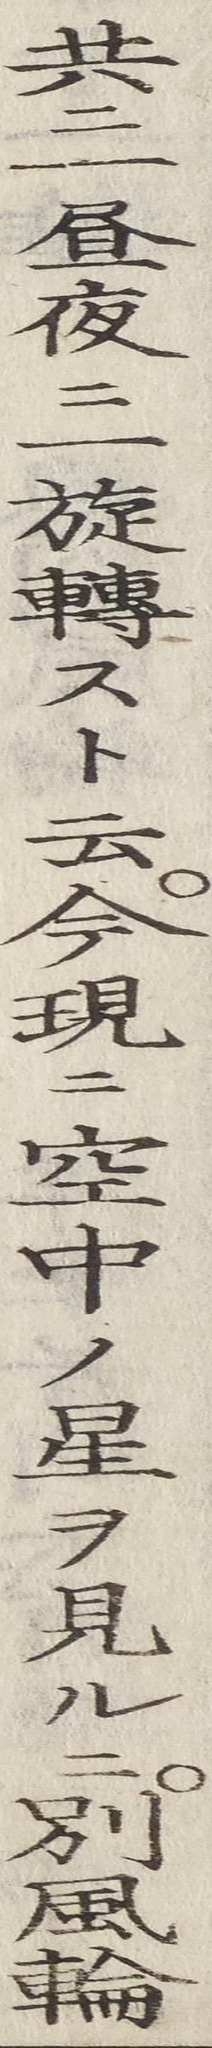共ニ一昼夜ニ一旋転スト云。今現ニ空中ノ星ヲ見ルニ。別風輪
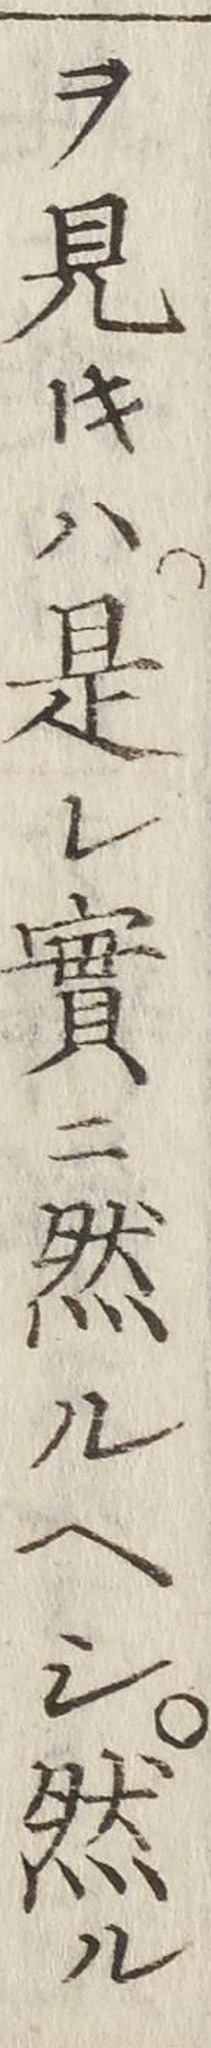ヲ見トキハ。是レ実ニ然ルヘシ。然ル
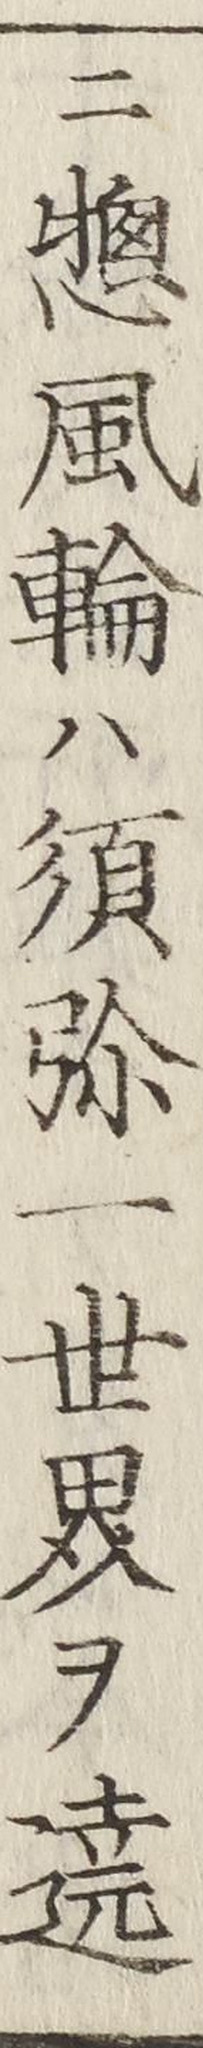ニ惣風輪ハ須弥一世界ヲ遶
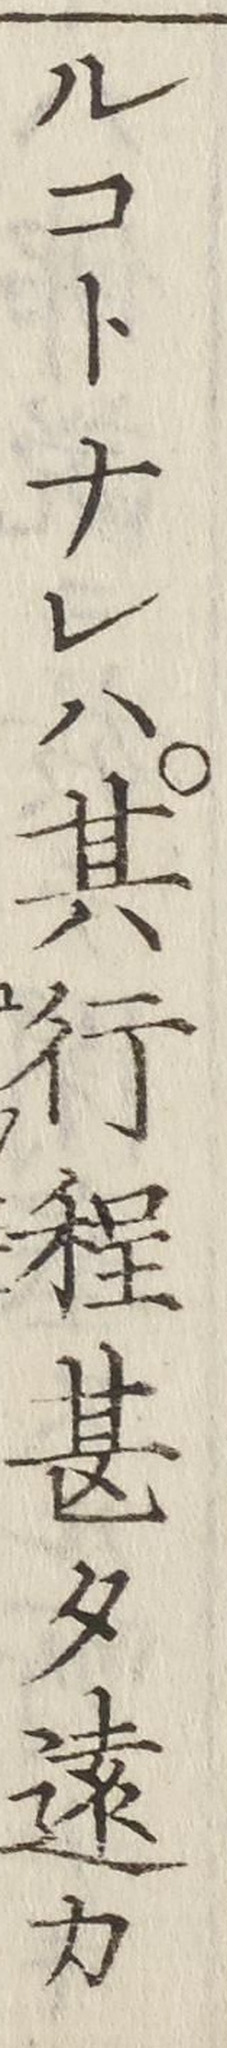ルコトナレハ。其行程甚タ遠カ
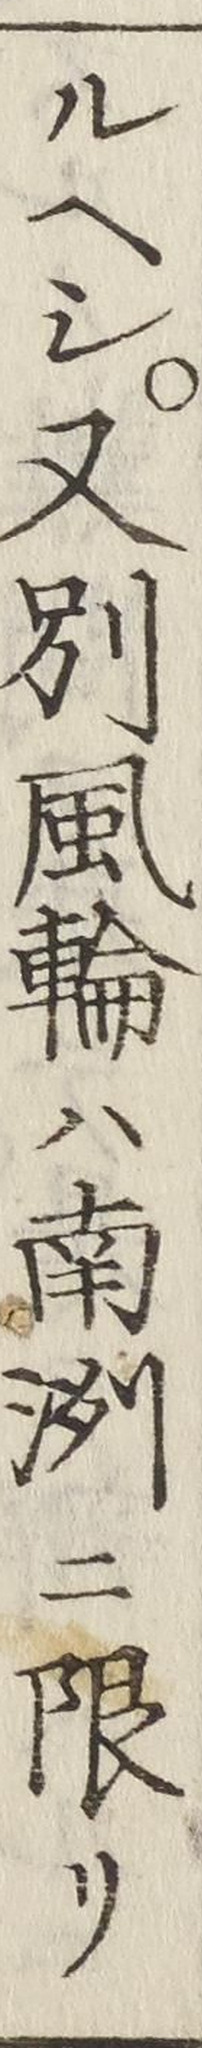ルヘシ。又別風輪ハ南洲ニ限リ
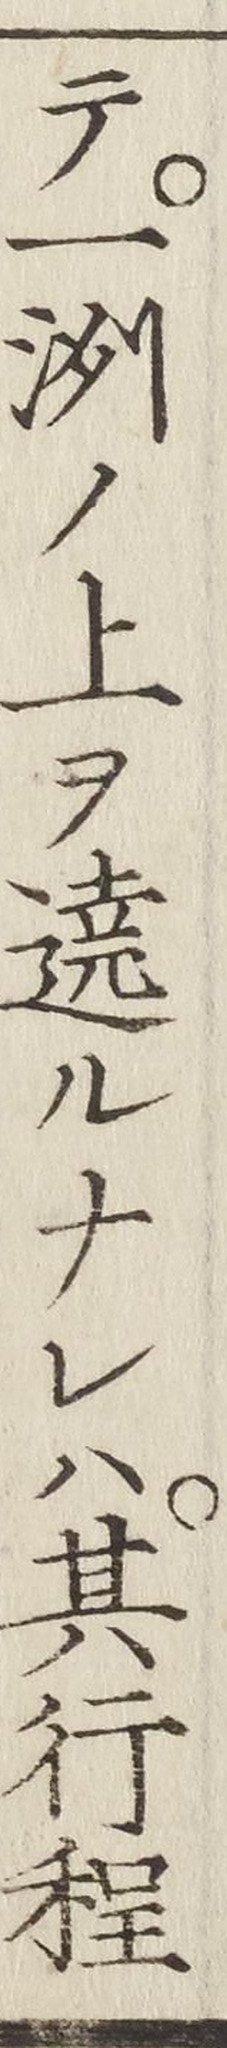テ。一洲ノ上ヲ遶ルナレハ。其行程
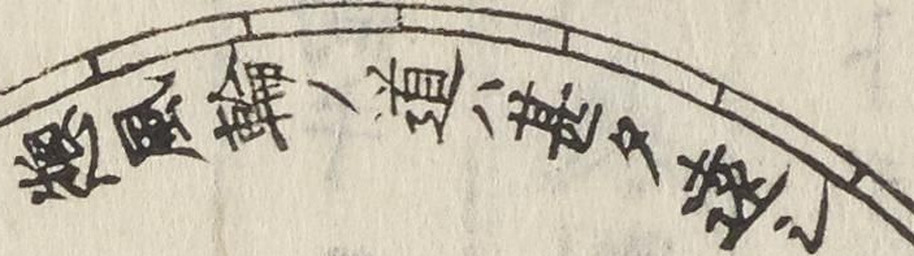惣風輪ノ道ハ甚タ遠シ
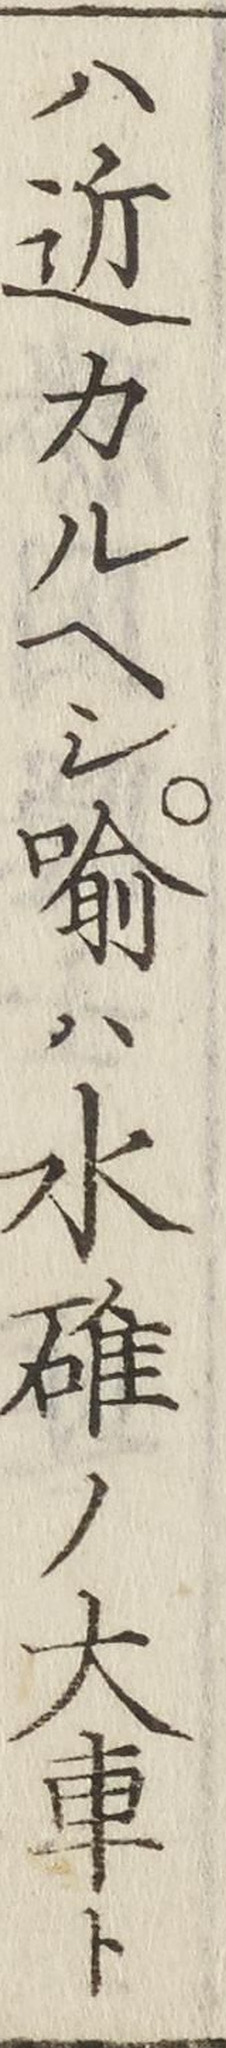ハ近カルヘシ。喩ハ水碓ノ大車ト
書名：護法新論　二編　上
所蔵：東京大学地震研究所図書室 Earthquake Research Institute Library, The University of Tokyo, JAPAN
